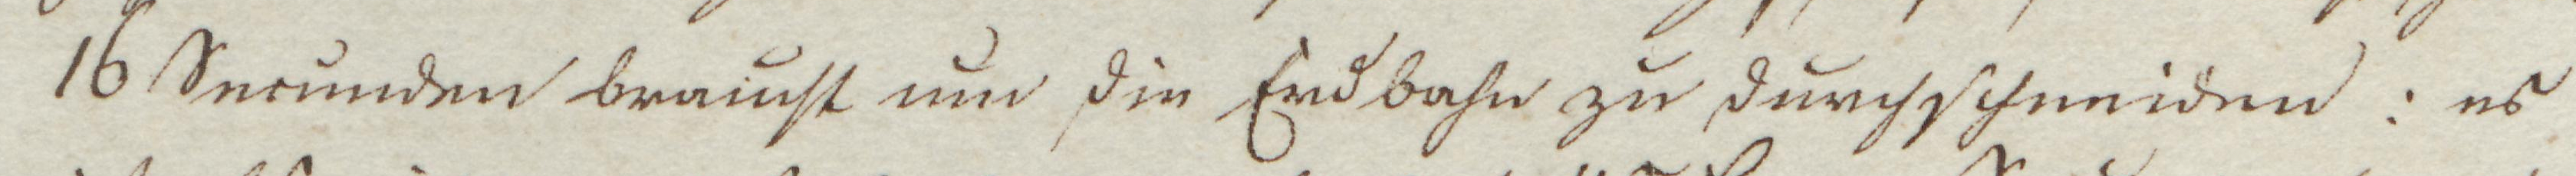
16 Secunden braucht um die Erdbahn zu durchschneiden: es
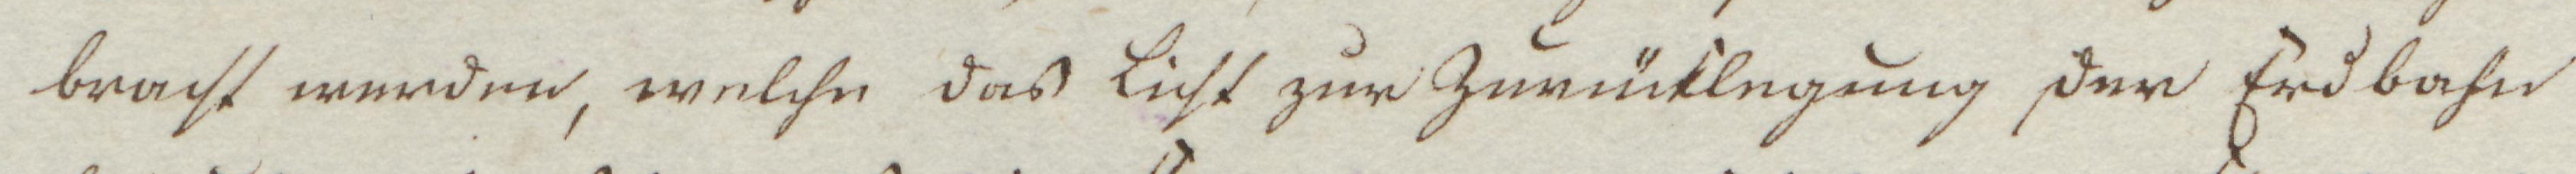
bracht werden, welche das Licht zur Zurücklegung der Erdbahn
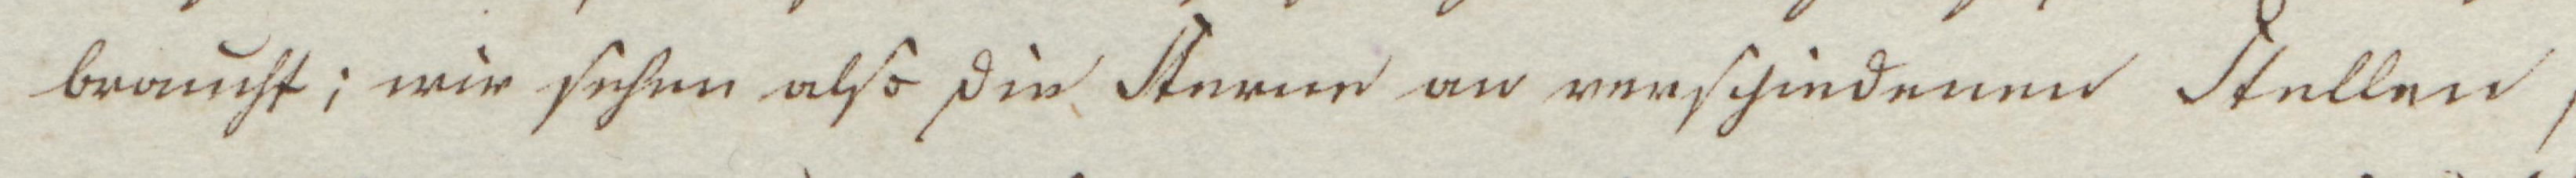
braucht; wir sehen also die Sterne an verschiedenen Stellen,
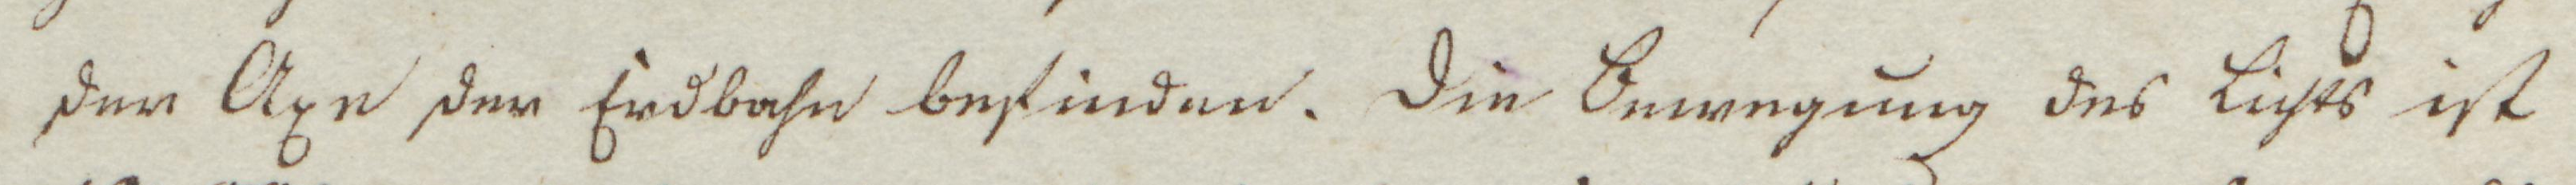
der Axe der Erdbahn befinden. Die Bewegung des Lichts ist
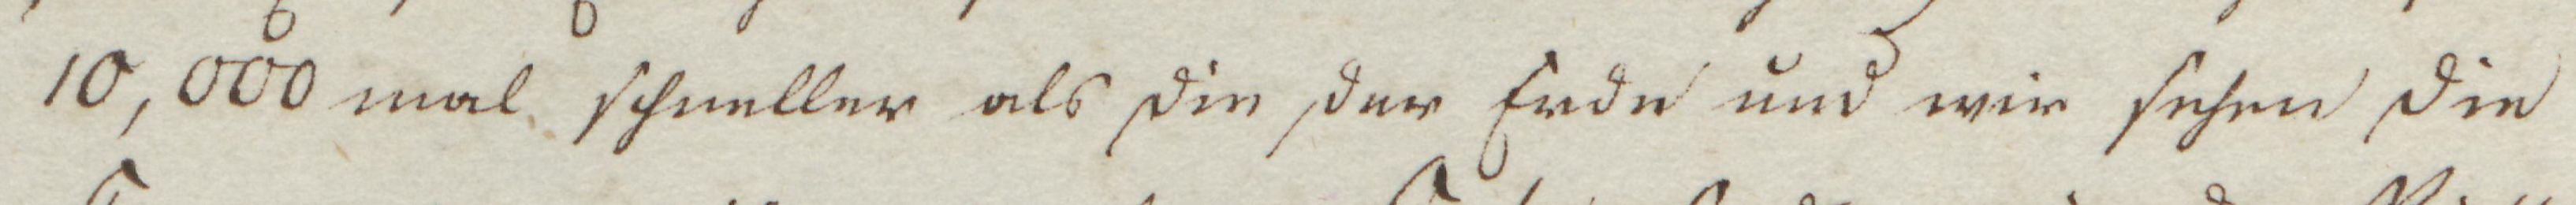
10,000 mal schneller als die der Erde und wir sehen die
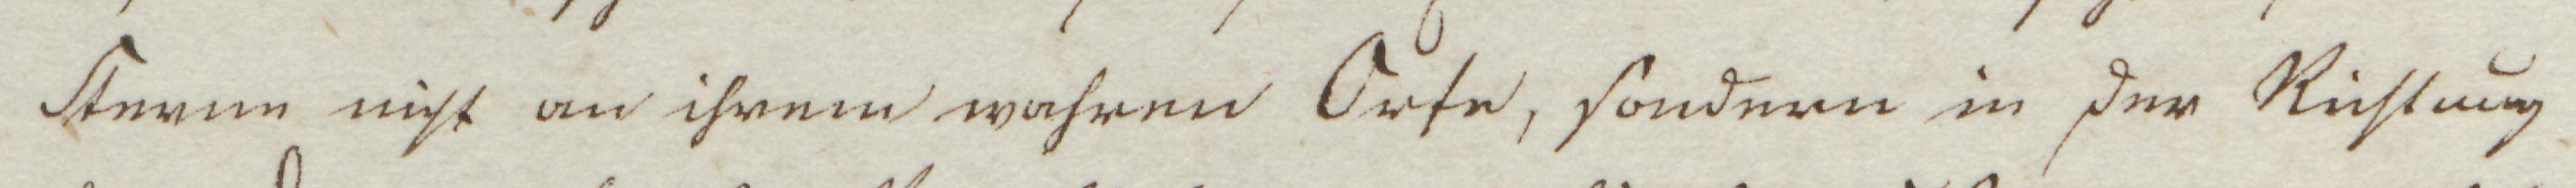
Sterne nicht an ihrem wahren Orte, sondern in der Richtung
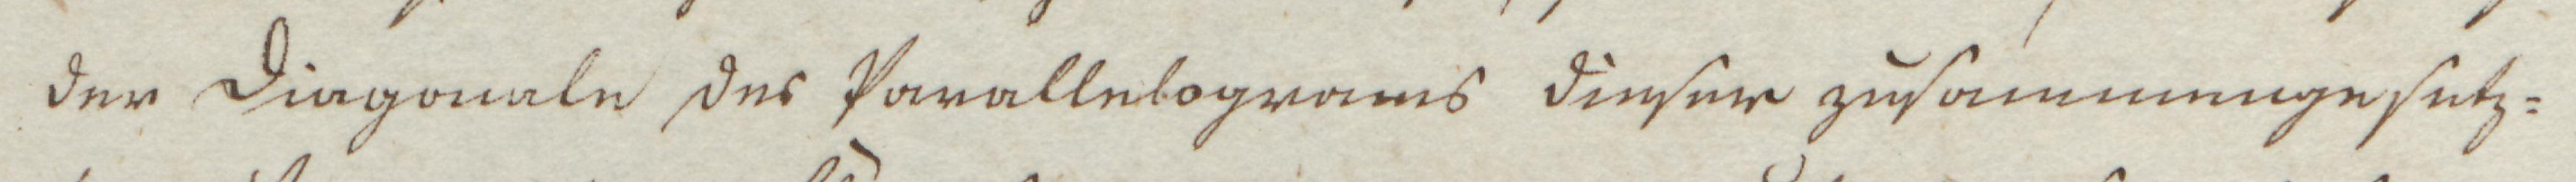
der Diagonale des Parallelograms dieser zusammengesetz-
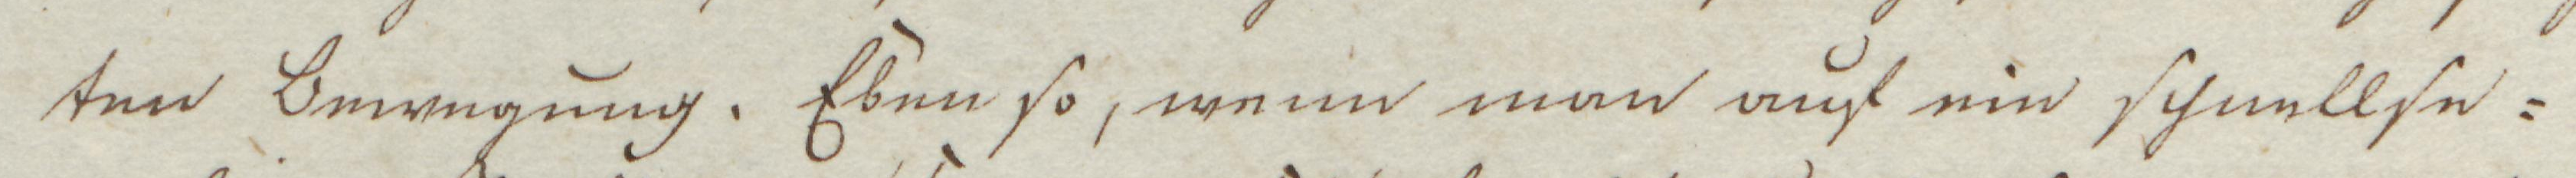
ten Bewegung. Eben so, wenn man auf ein schnellse-
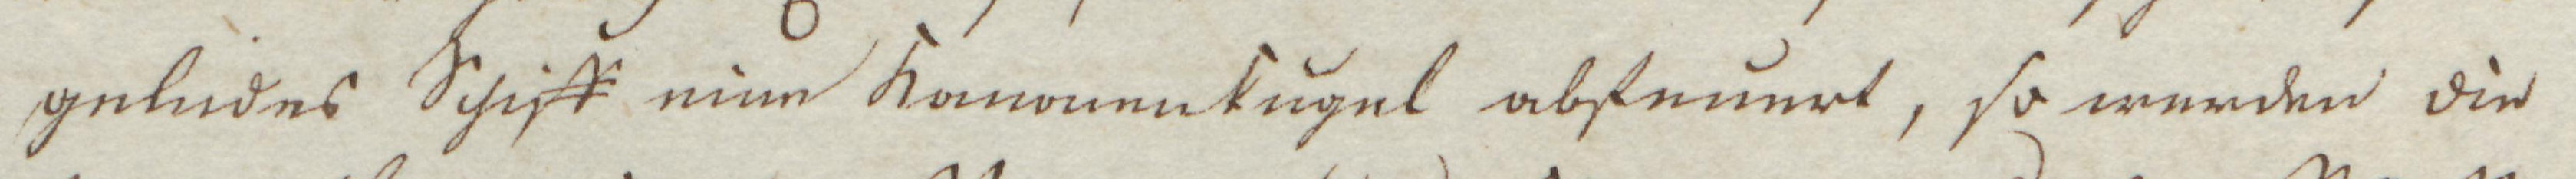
gelndes Schiff eine Kanonenkugel abfeuert, so werden die
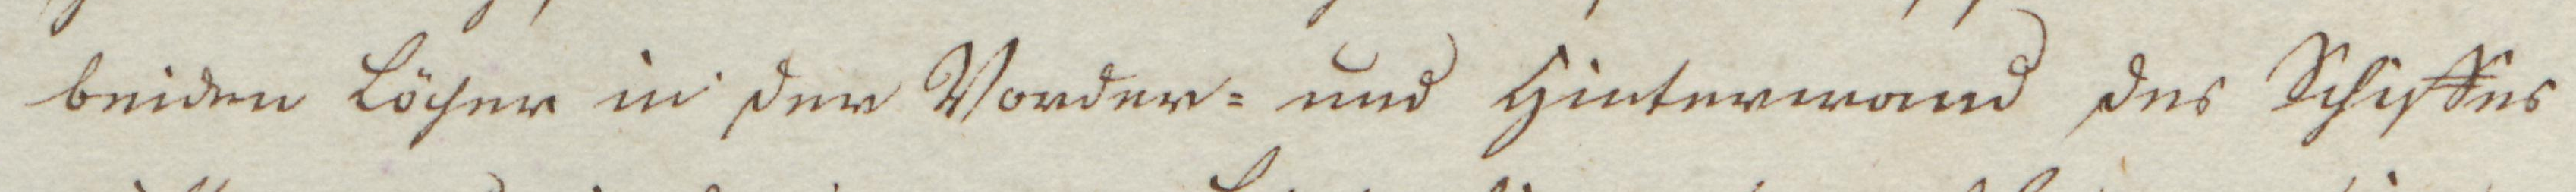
beiden Löcher in der Vorder- und Hinterwand des Schiffes
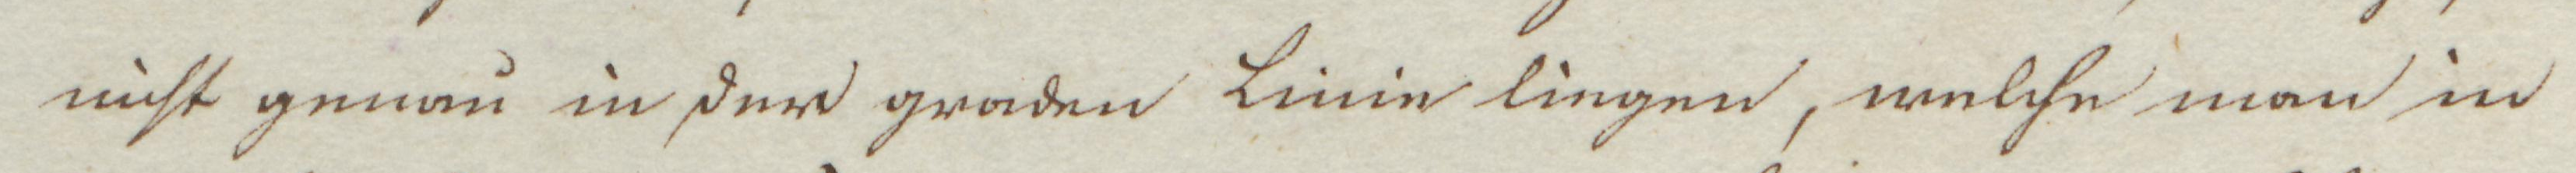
nicht genau in der graden Linie liegen, welche man in
